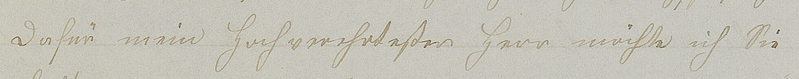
Dafür mein Hochverehrtester Herr möchte ich Sie
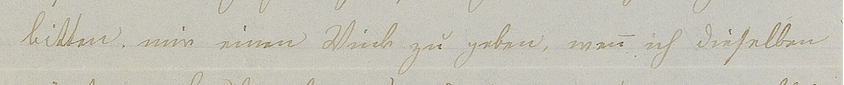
bitten, mir einen Wink zu geben, wenn ich dieselben
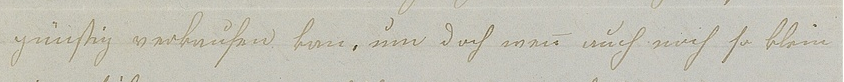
günstig verkaufen kann, um doch wenn auch noch so klein
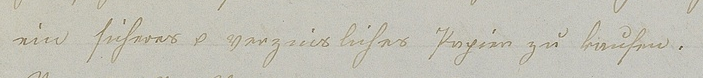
ein sicheres & verzinsliches Papier zu kaufen.
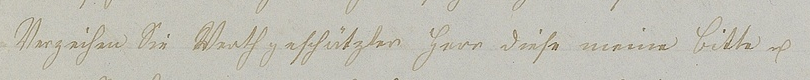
Verzeihen Sie Werthgeschätzter Herr diese meine Bitte &
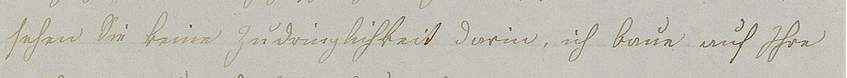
sehen Sie keine Zudringlichkeit darin, ich baue auf Ihre
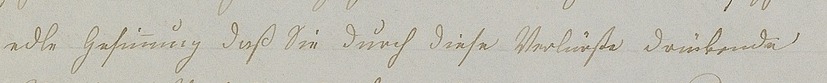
edle Gesinnung daß Sie durch diese Verlürste drückende
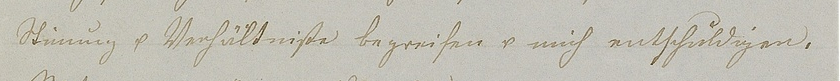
Stimung & Verhältniße begreifen & mich entschuldigen.
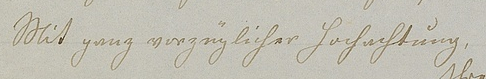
Mit ganz vorzüglicher Hochachtung,
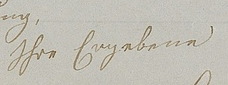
Ihre Ergebene
